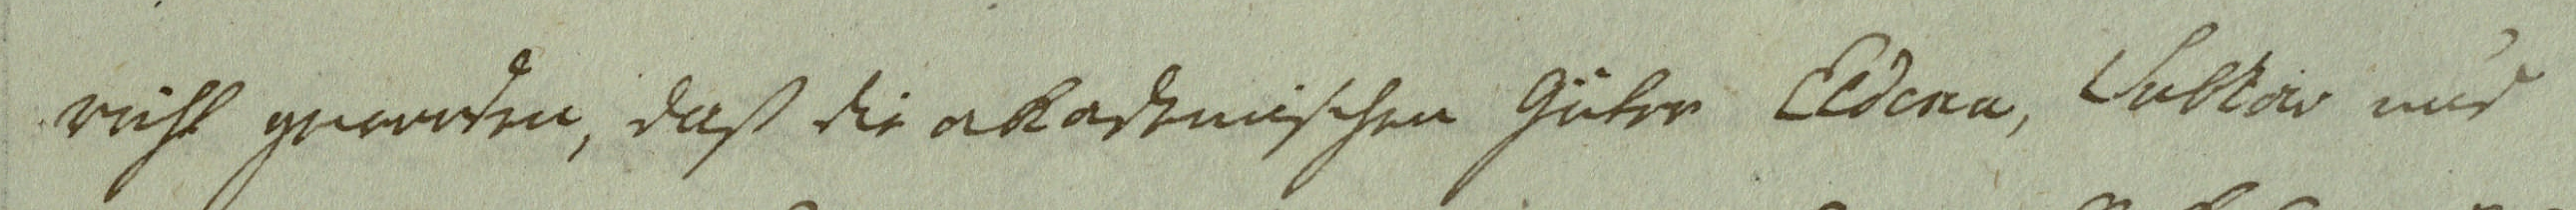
richt geworden, daß die akademischen Güter Eldena, Subzow und
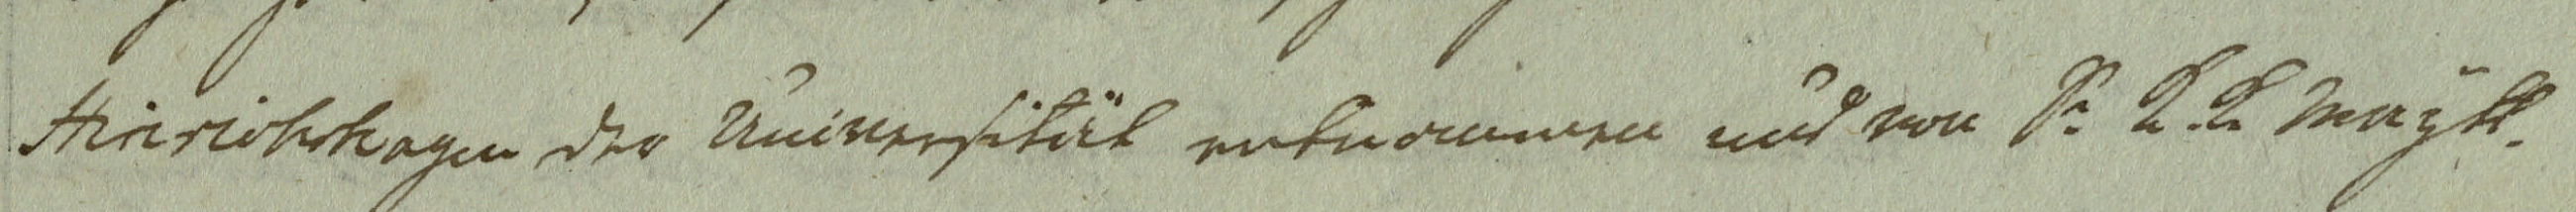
Hinrichshagen der Universität entnommen und von Sr. K. H. Maÿtt.
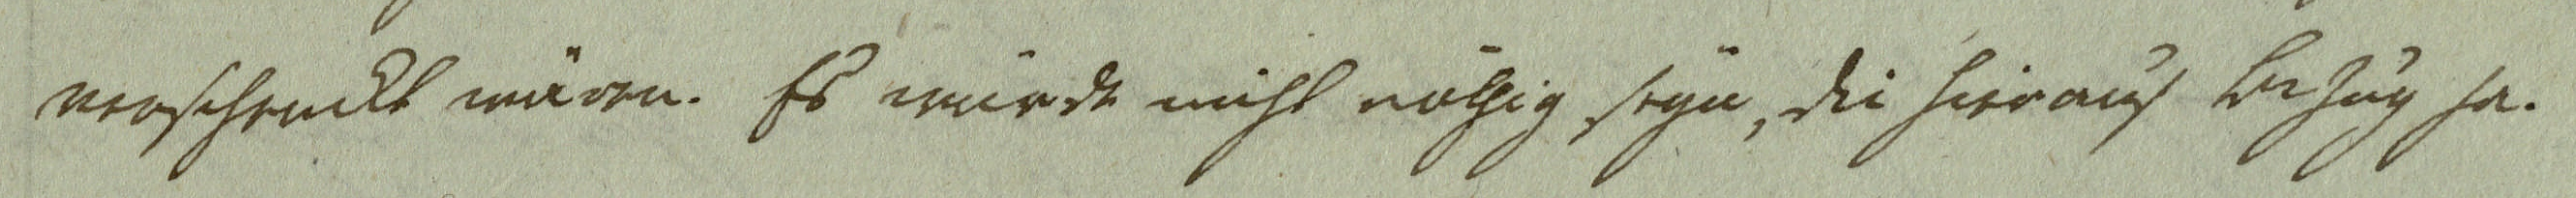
verschenckt wären. Es würde nicht nöthig seÿn, die hierauf Bezug ha¬
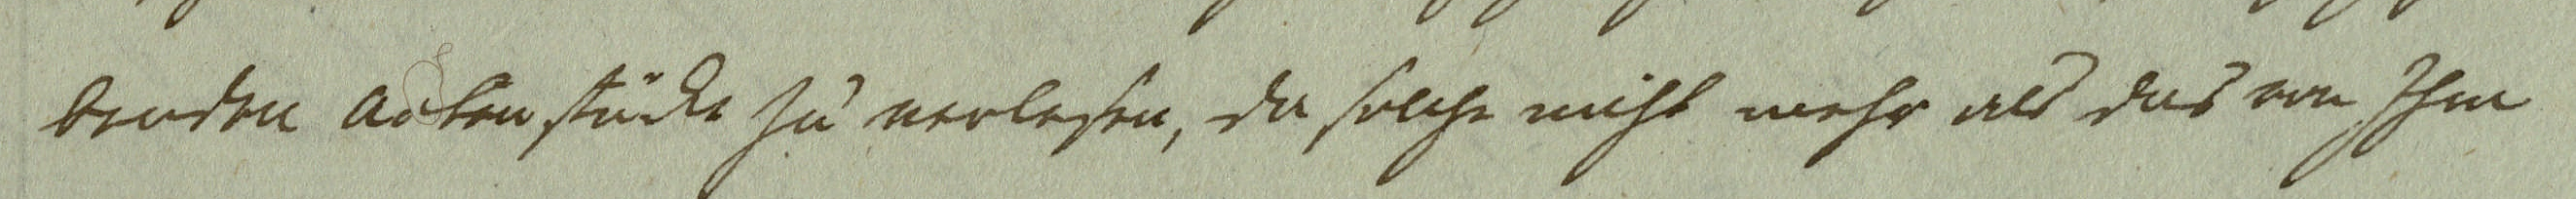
benden Actenstücke zu verlesen, da solche nicht mehr als das von Ihm
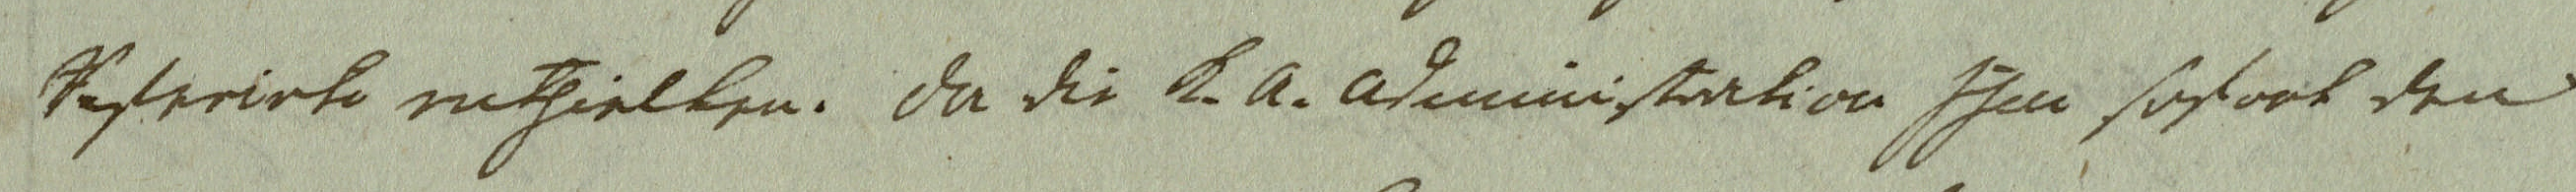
Referirte enthielten. Da die K. A. Administration Ihm sofort den
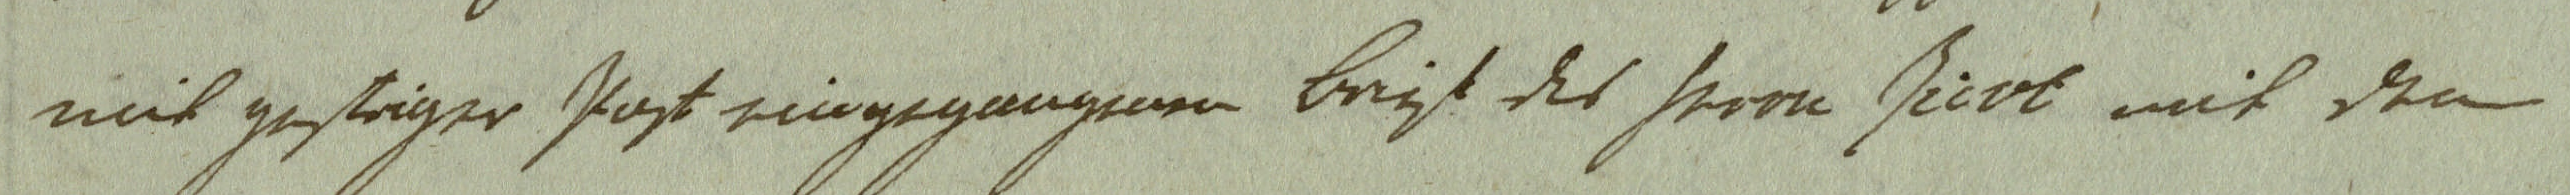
mit gestriger Post eingegangenen Brief des herrn Ricot mit den
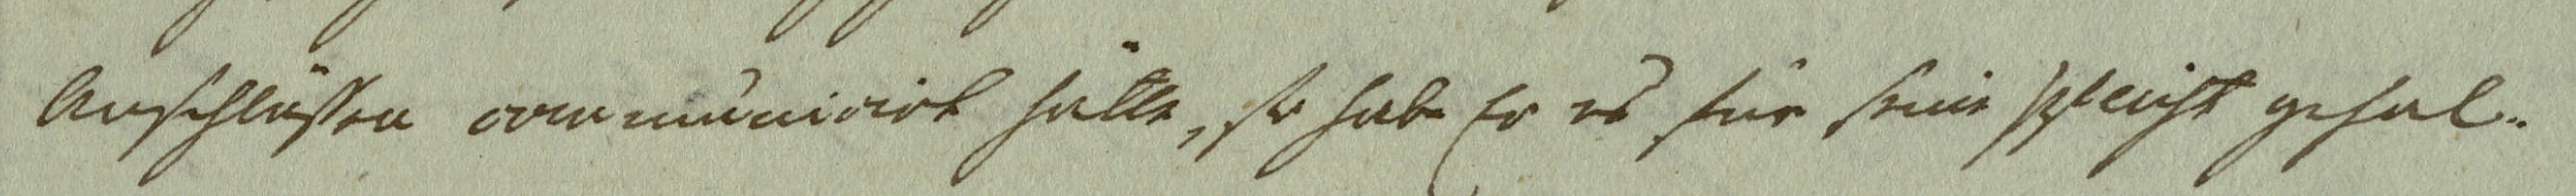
Anschlüssen communicirt hätte, so habe Er für seine Pflicht gehal¬
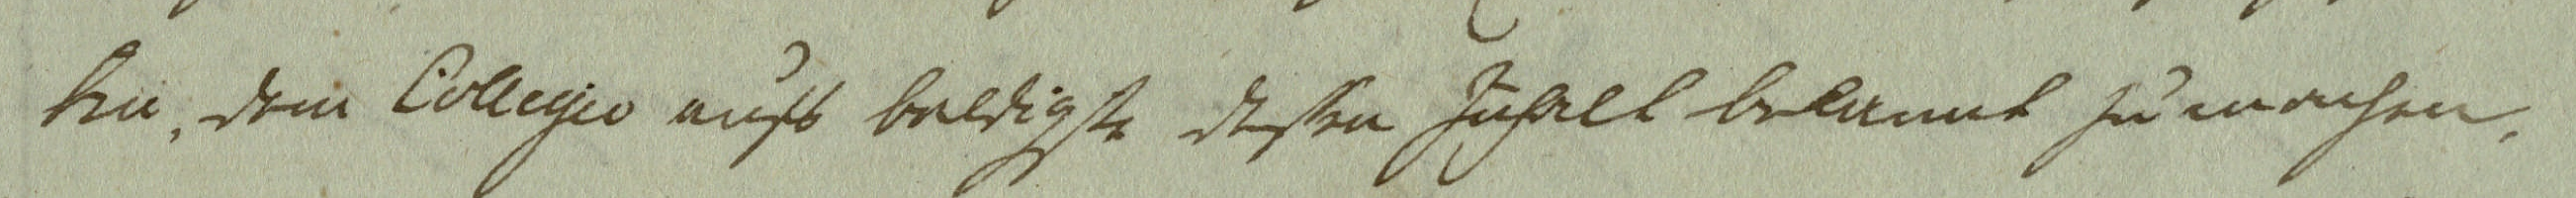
ten, dem Collegio aufs baldigste dessen Inhalt bekannt zu machen,
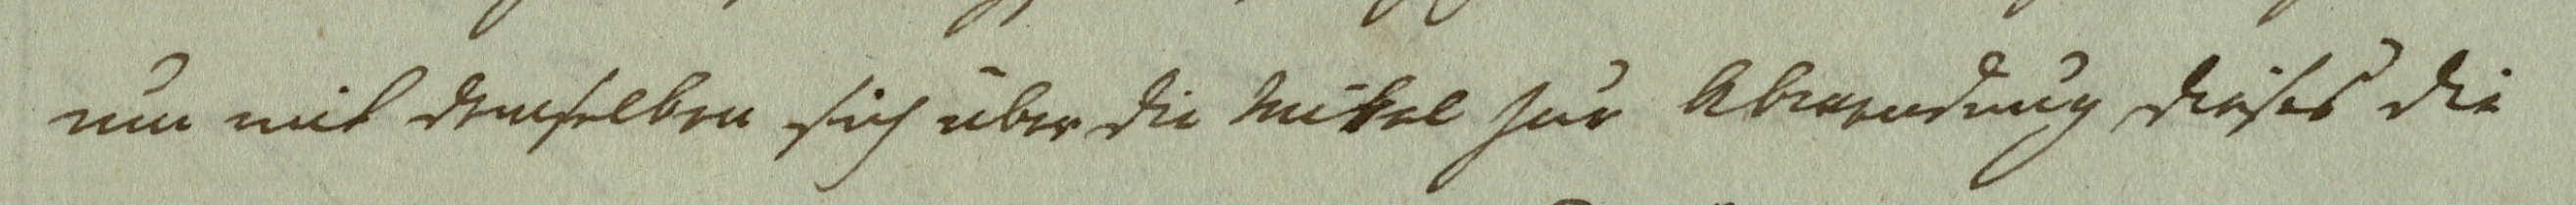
um mit demselben sich über die Mittel zur Abwendung dieses die
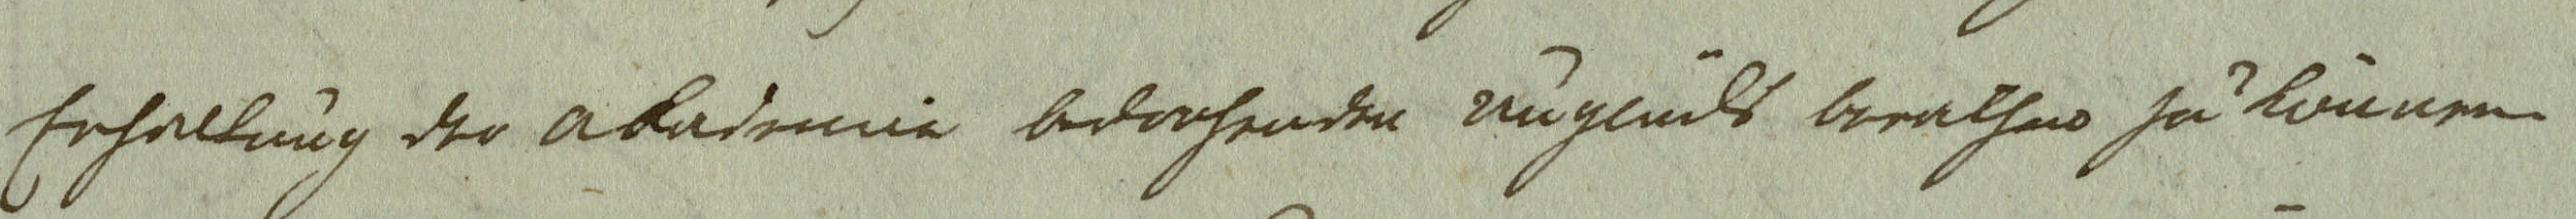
Erhaltung der Akademie bedrohenden Unglücks berathen zu können.
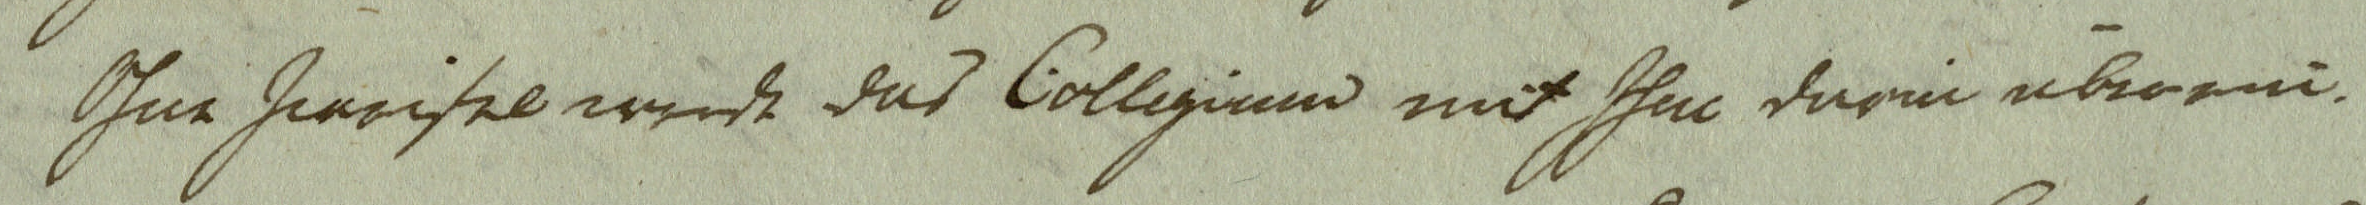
Ohne Zweifel werde das Collegium mit Ihm darin überein¬
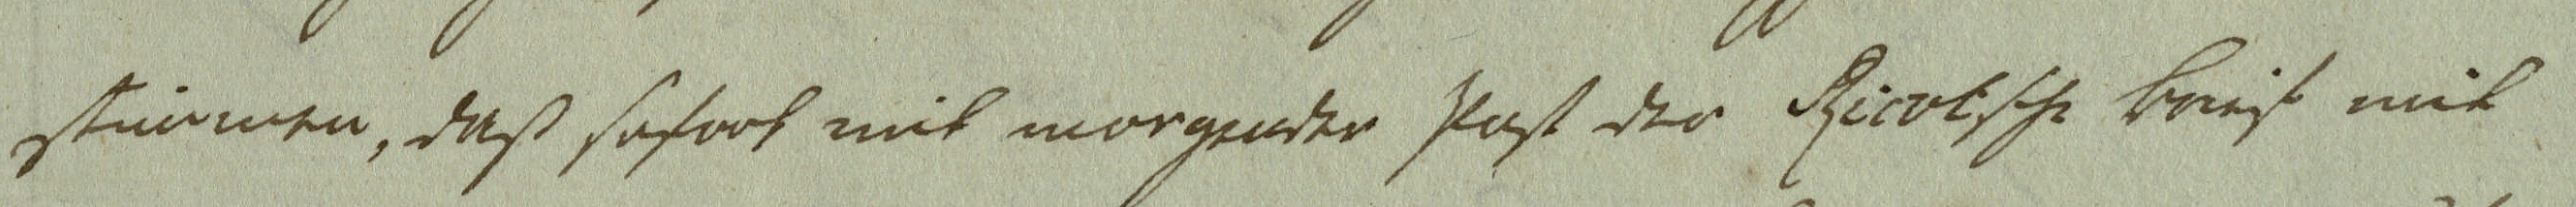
stimmen, daß sofort mit morgender Post der Ricotsche Brief mit
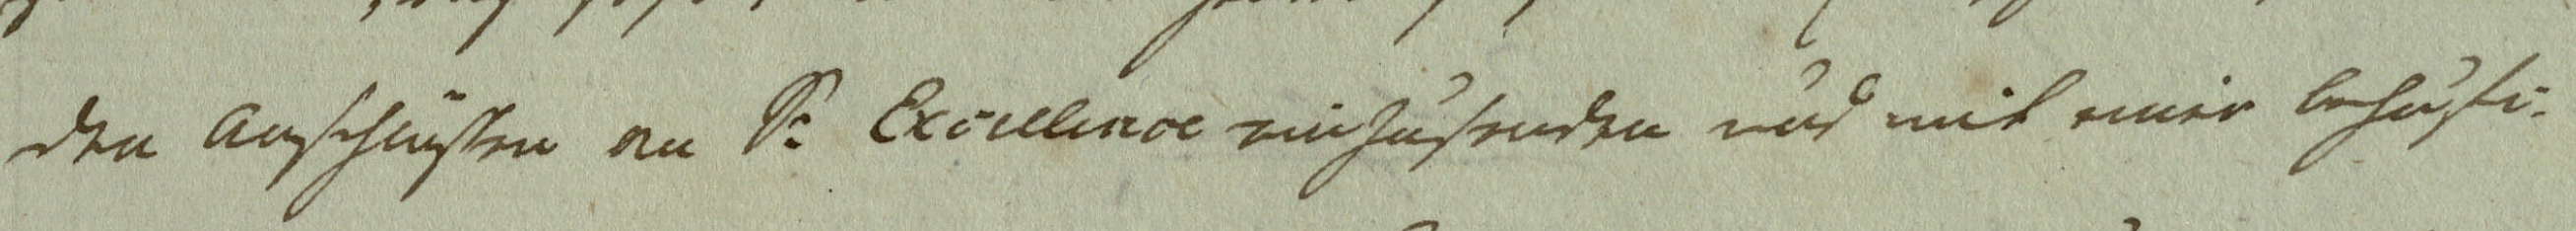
den Anschlüssen an Sr. Excellence einzusenden und mit einer behufi¬
